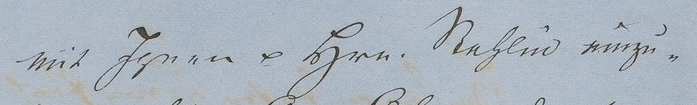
mit Ihnen & Hrn. Stehlin einzu-
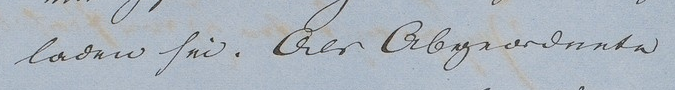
laden sei. Als Abgeordnete
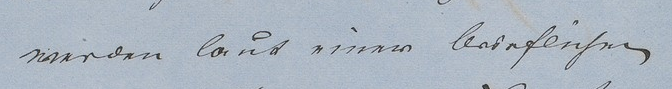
werden laut einer brieflichen
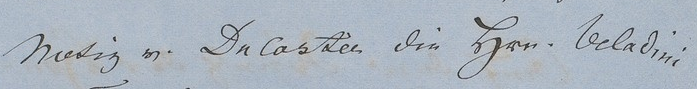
Notiz v. Du Coster die Hrn. Veladini
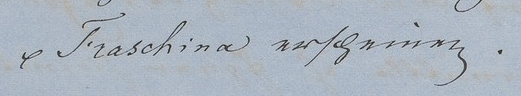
& Fraschina erscheinen.
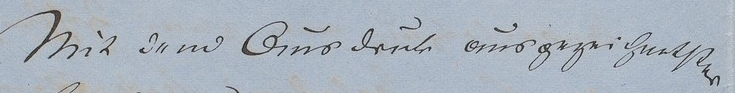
Mit dem Ausdruk ausgezeichnetster
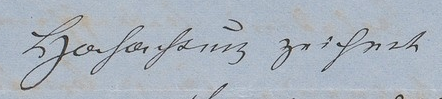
Hochachtung zeichnet
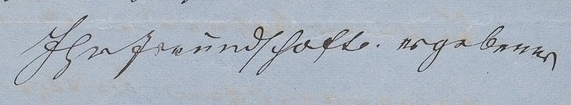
Ihr freundschaftl. ergebener
